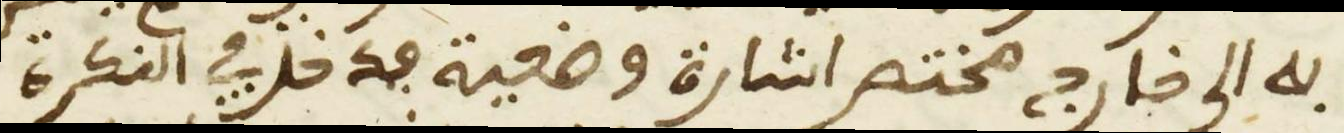به الى خارج مختصر اشارة وضعية فدخل في النكرة
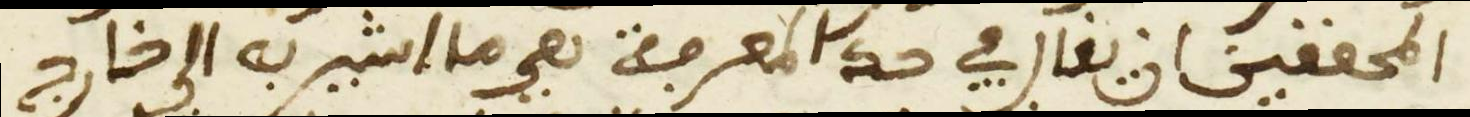المحققين ان يقال في حد المعرفة هي ما اشير به الى خارج
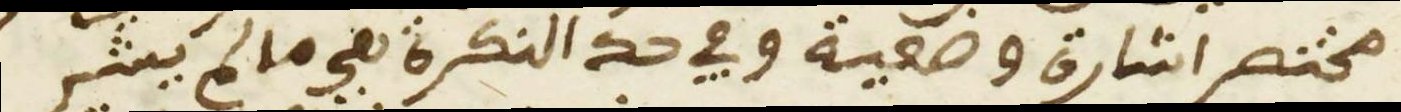مختصر اشارة وضعية وفي حد النكرة هي ما لم يشير
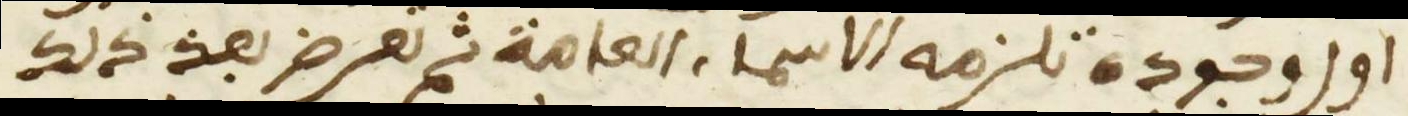اول وجوده تلزمه الاسماء العامة ثم تعرض بعد ذلك
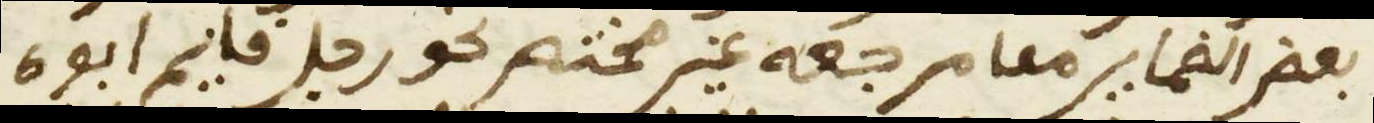بعض الضماير معا مرجعه غير مختصر نحو رجل قايم ابوه
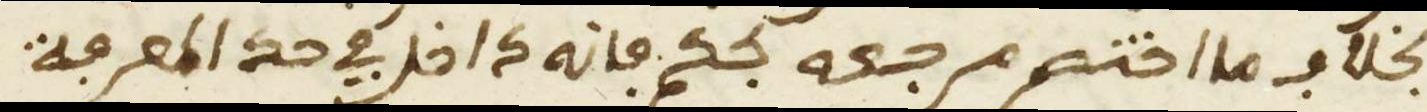بخلاف ما اختصر مرجعه بحكم فانه داخل في حد المعرفة
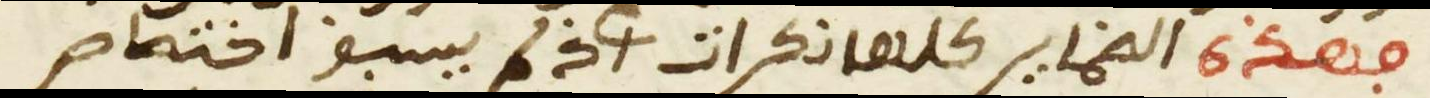فهذه الضماير كلها نكرات اذ لم يسبق اختصاص
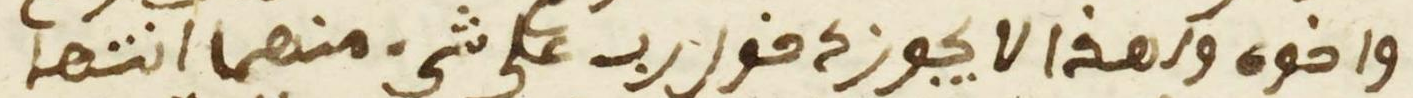واخوه ولهذا لا يجوز دخول رب على شيء منهما انتها
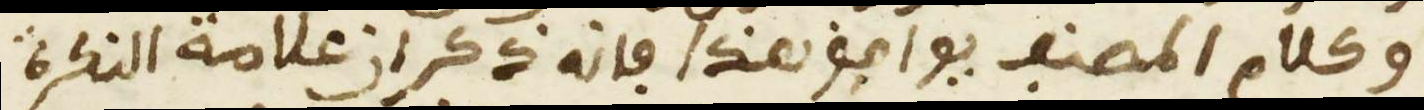وكلام المصنف يوافق هذا فانه ذكر ان علامة النكرة
